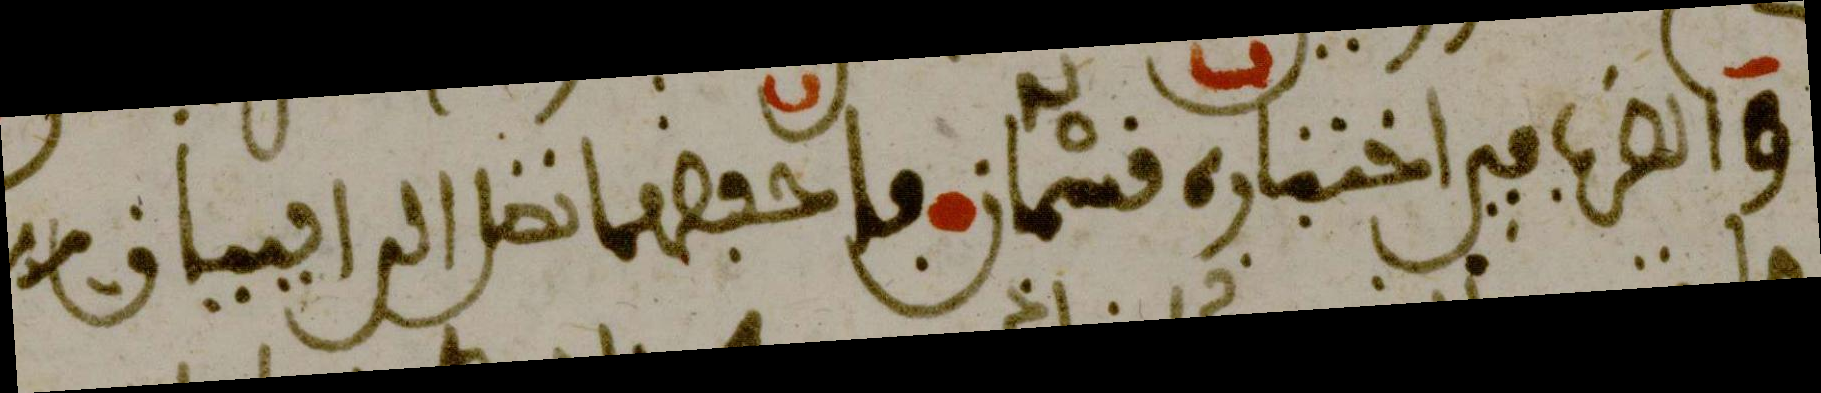و الضرب في اختباره قسمان فاحفضهما تصل الى البيان
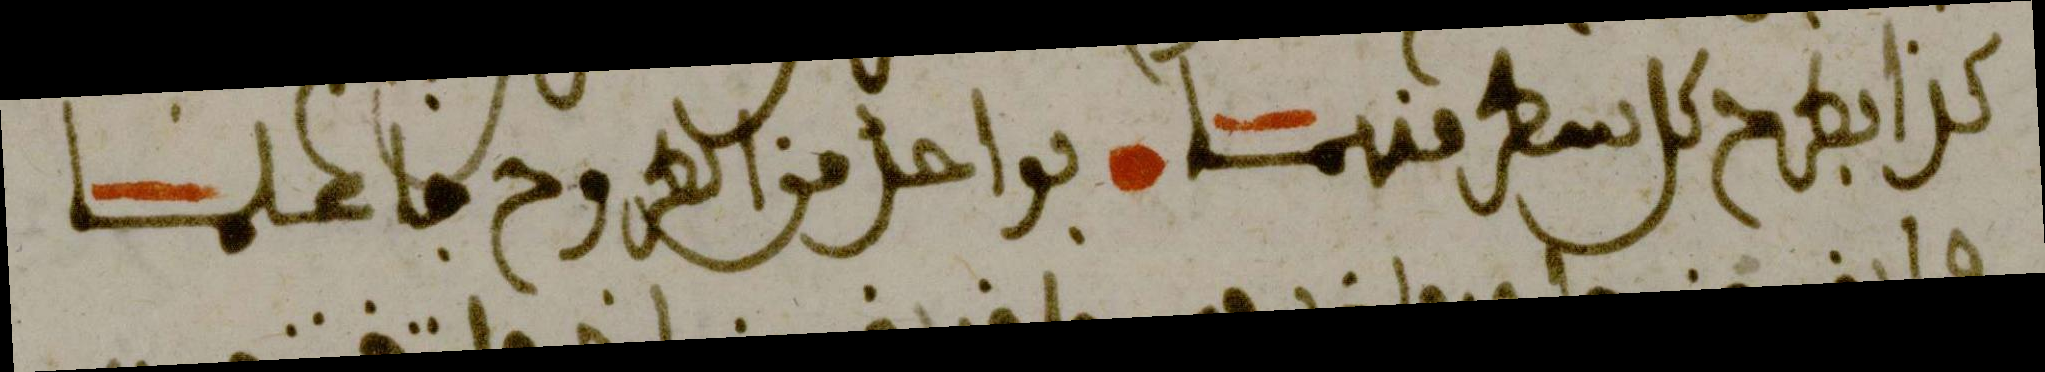كذا بطرح كل سطر منهما بواحد من الطروح فاعلما
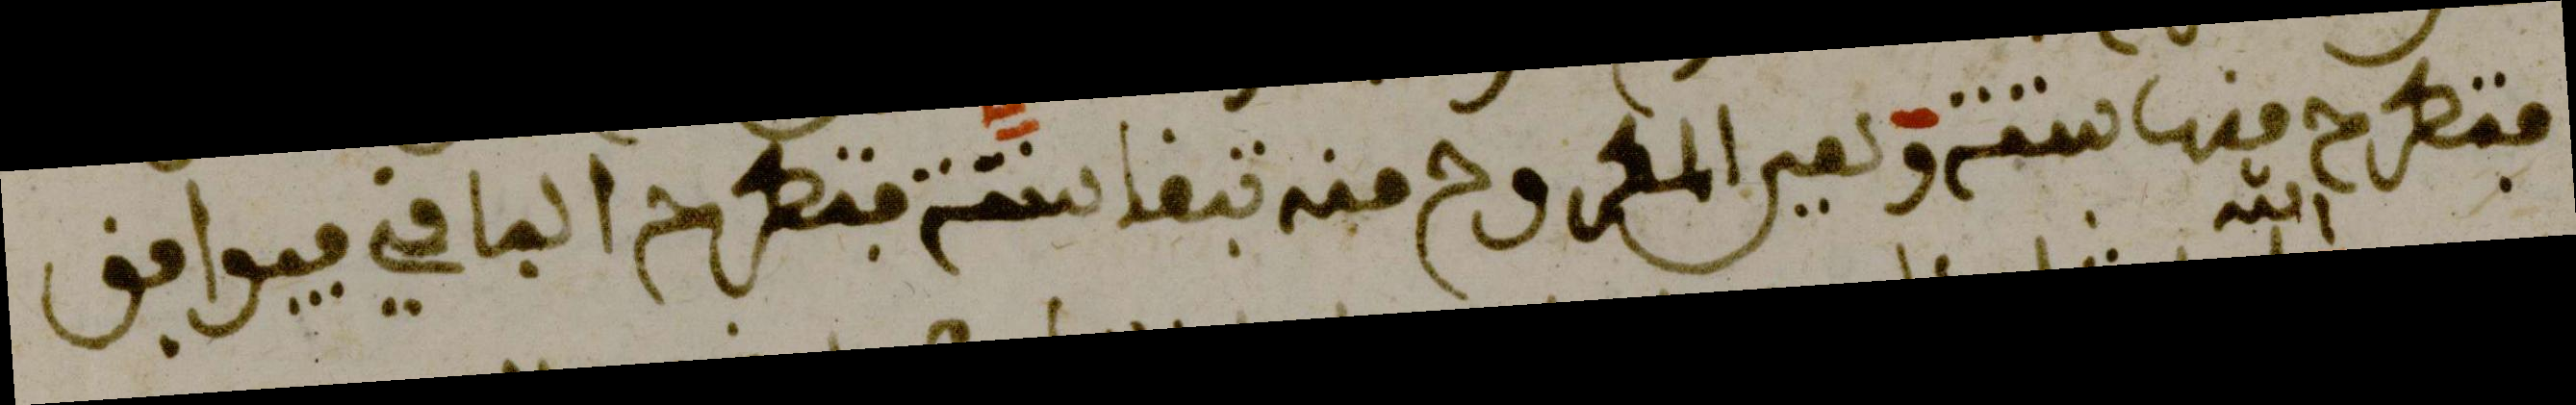فتطرح منها ستة وهي المطروح منه تبقا ستّة فتطرح الباقي فيوافق
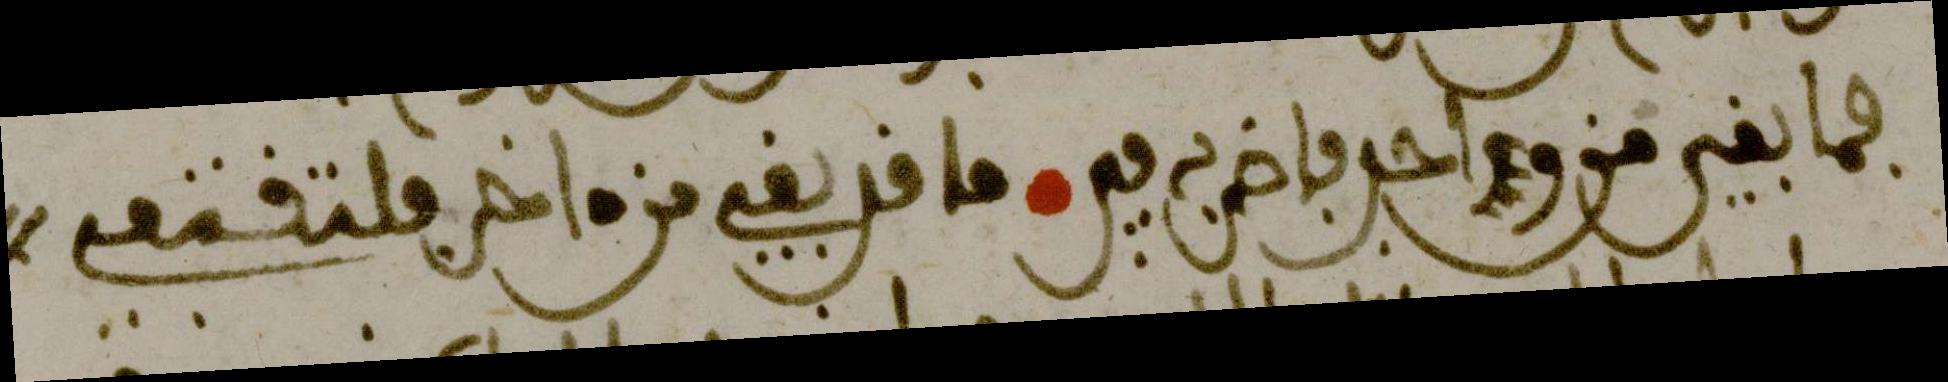فما بقي من واحد فاضربه في ما قد بقي من ءاخر فلتقتفي
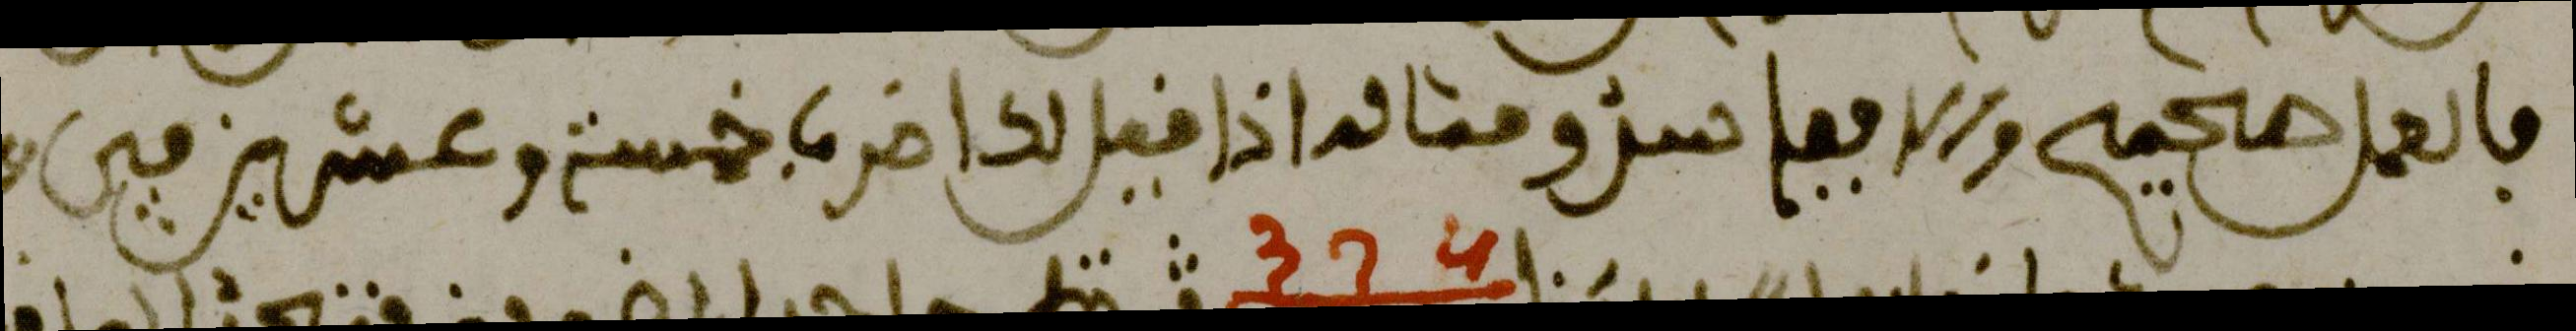فالعمل صحيح و الا ففاسد و مثاله اذا قيل لك اضرب خمسة و عشرين في
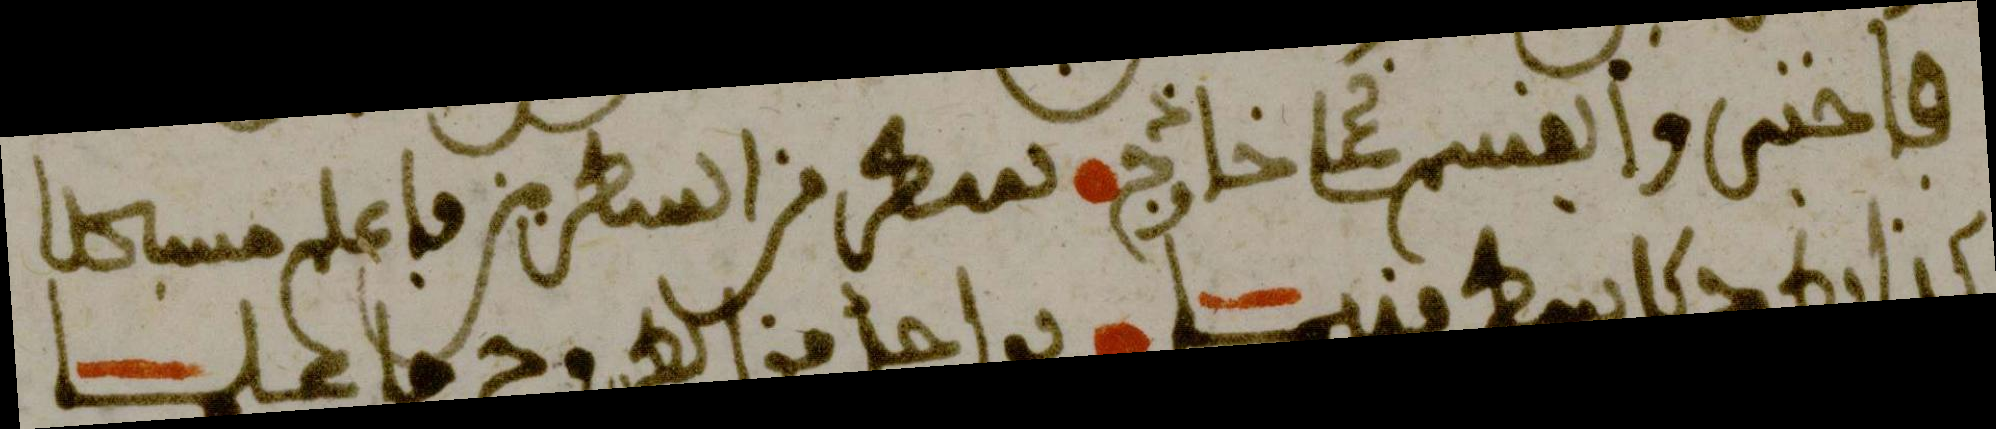فاختبر والقسم على خارج سطر من السطرين فاعلم مسجلا
